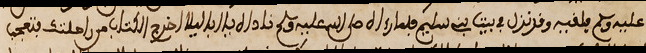عليه وسلم فلقيه وقد نزل في بيت بنى سليم فلما رءاه صلى الله عليه وسلم ناداه يا ابا ليلا اخرج الكتاب من راحلتك فتعجب
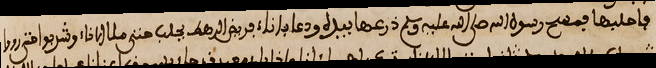فاحلبها فمسح رسول الله صلى الله عليه وسلم ذرعها بيده وودعا باناء فريض الرهط يحلب حتى ملا الاناء وشربوا حتى رووا
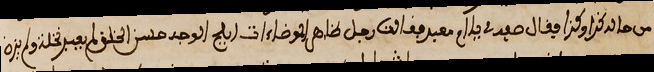من حاله كذا وكذا فقال صفه في يا ام معبد فقالت رجل ظاهر الموضاءات ابلج الوجه حسن الخلق لم يعبد نخلة ولم يزه
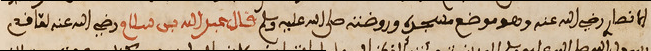الانصارى رضي الله عنه وهو موضع مسجده وروضته صلى الله عليه سلم قال عبد الله بن سلام رضي الله عنه لمّا قدم
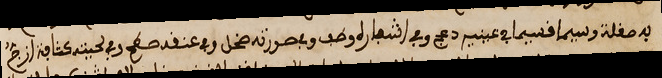به صقلة وسيما قسيما في عينيه دعج وفي اشفاره وطف وفي صورته ضحل وفي عنقه صطع وفي لحيته كثافة ازجٌ
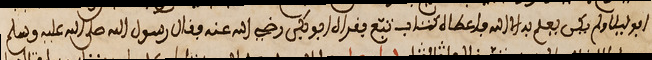ابو ليلا ولم يكن يعلم به الا الله فاعطاه كتاب تبّع فقراه ابو بكر رضي الله عنه فقال رسول الله صلى الله عليه وسلم
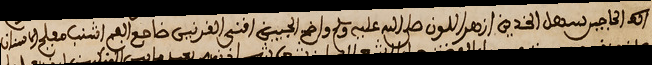# الحاجبين سهل الخدين ازهر اللون صلى الله عليه وسلم واضح الجبين اقنى الغرنين ضاحع الفم اشنب مفلج الاسنان
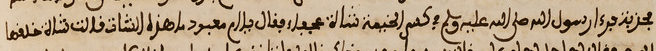مجذبة فرءا رسول الله صلى الله عليه وسلم في كسر الخيمة شاة عجفاء فقال يا ام معبود ما هذه الشات قالت شاة خلقها
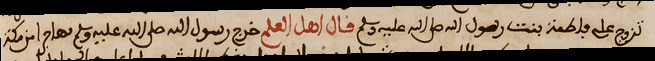تزوج على فاطمة بيت رسول الله صلى الله عليه وسلم قال اهل العلم خرج رسول الله صلى الله عليه وسلم مهاجرا من مكة
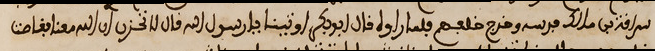سراقة بن مالك فرسه وخرج خلفهم فلما راوا قال ابو بكر اوتينا يا رسول الله قال لا تحزن ان الله معنا فغاصت
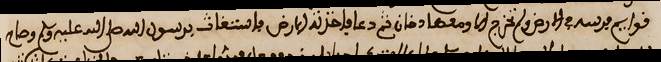قوايم فرسه في الارض ولم تخرج الا ومعها دخان ثم دعا فاخذته الارض فاستغاث برسول الله صلى الله عليه وسلم وصاح
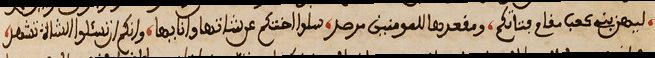ليهن بنى كعب مقام فتاتكم ومقعدها للمومنين مرصد سلوا اختكم عن شاتها وانايها وانكم ان تسئلوا الشاة تشهد
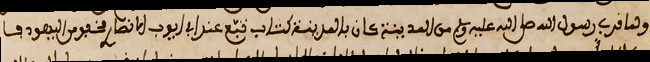ولما قرب رسول الله صلى الله عليه وسلم من المدينة كان بالمدينة كتاب تبّع عند ابى ايوب الانصارى مخبو من اليهود فا
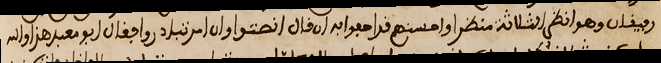رفيقان وهو انطر الثلاثة منظر او احسنهم قد احفوا به ان قال انصتوا وان امر تبادروا فقال ابو معبد هذا والله
